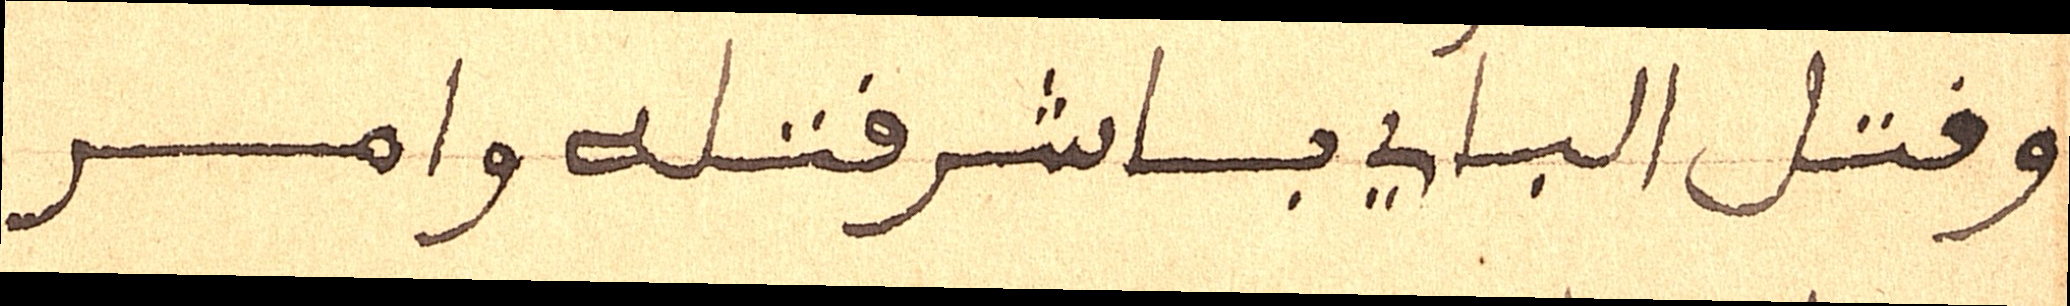وقتل الباي باشر قتله وامر
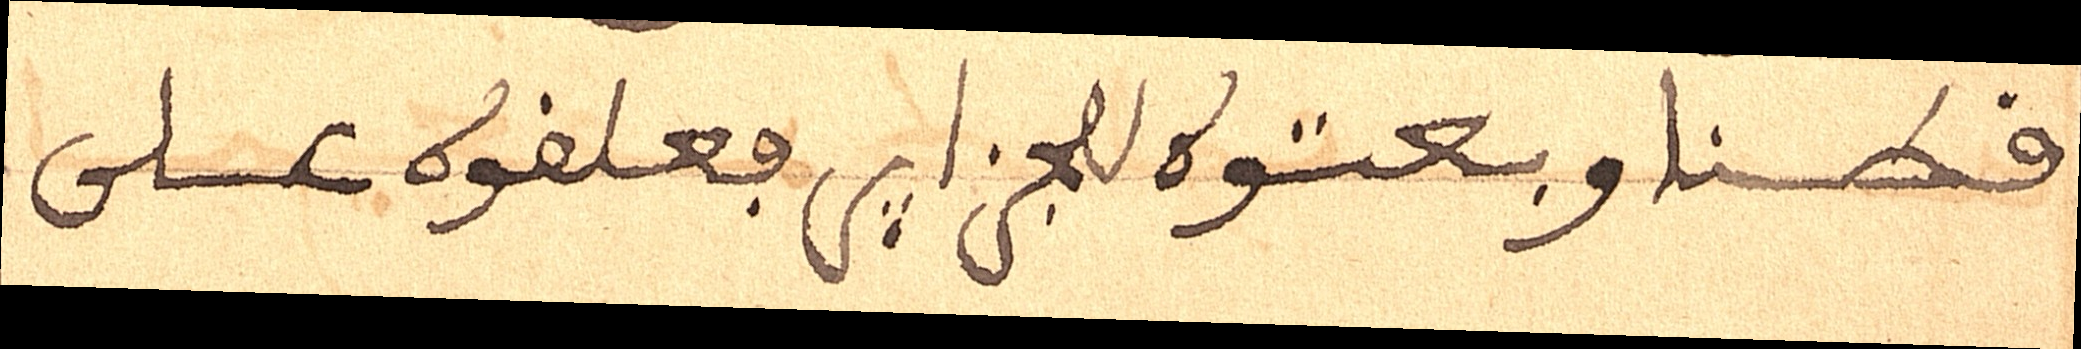قطنا وبعتوه للجزائر فعلقوه على
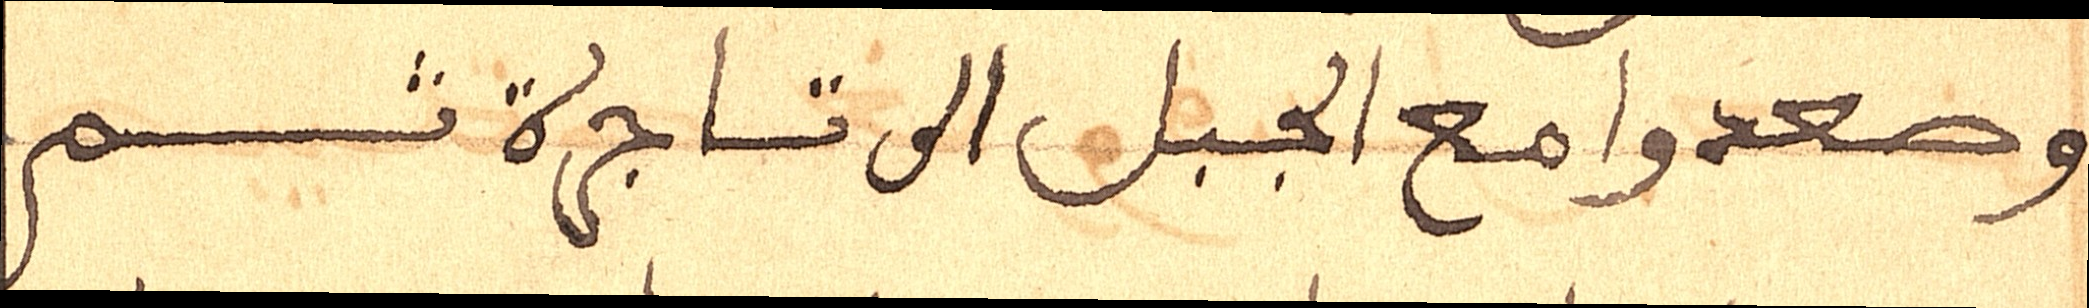وصعدوا مع الجبل الى تاجرة ثم
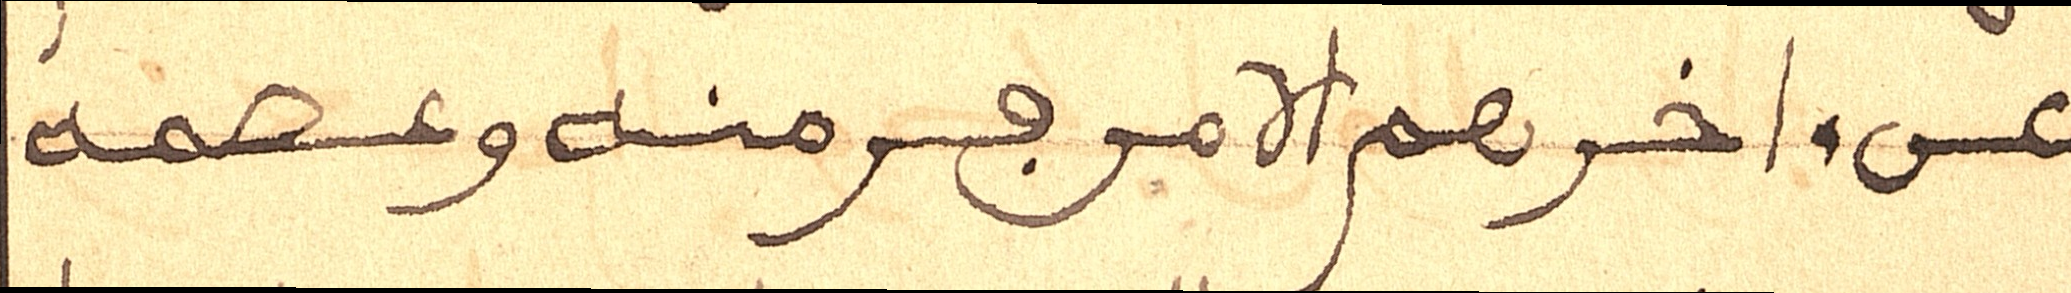عن ءاخرهم الامر فر منه وعصمه
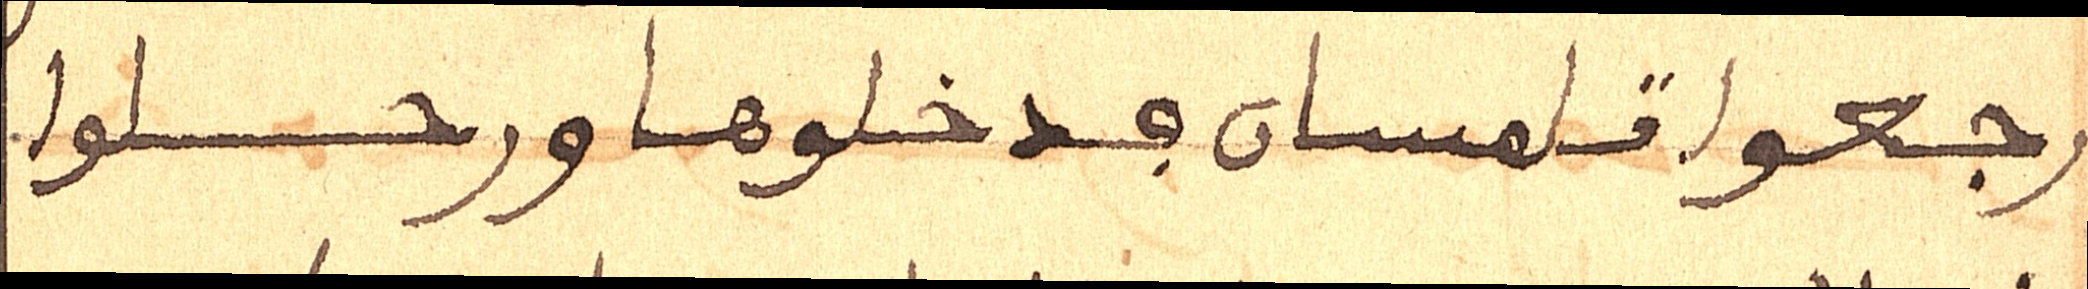رجعوا تلمسان فدخلوها ورحلوا
